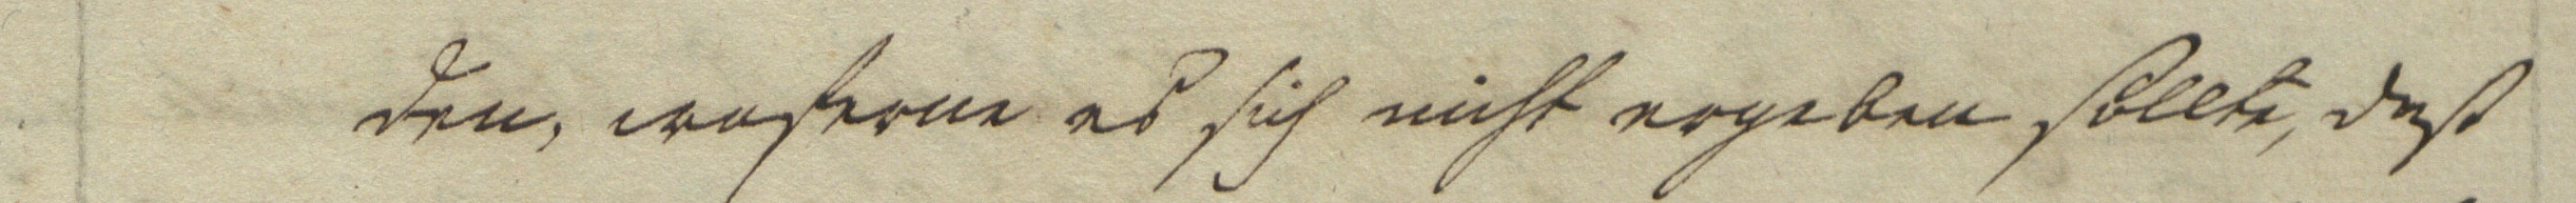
den, woferne es sich nicht ergeben sollte, daß
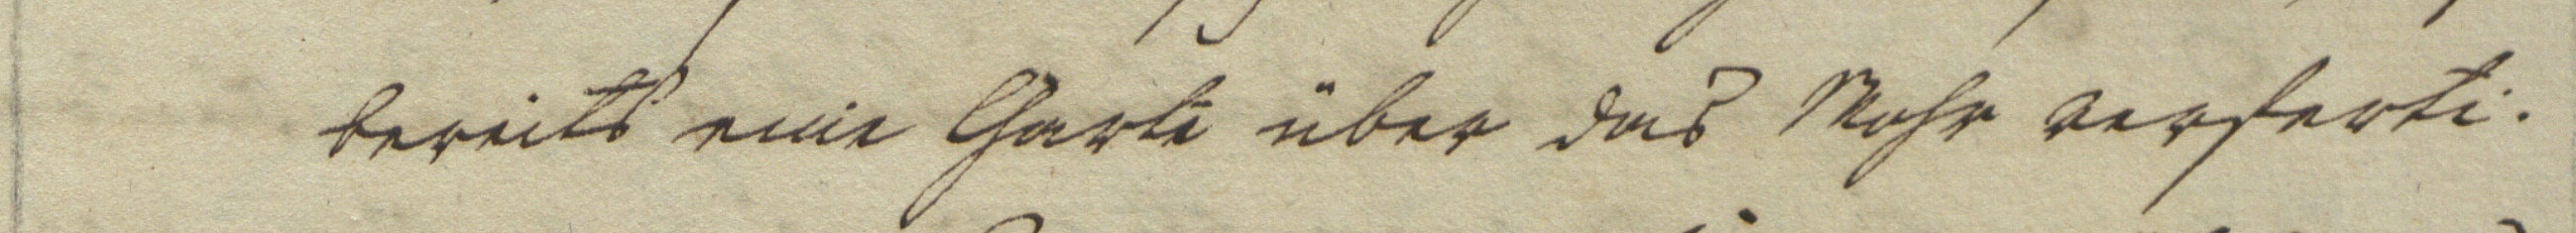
bereits eine Charte über das Mohr verferti¬
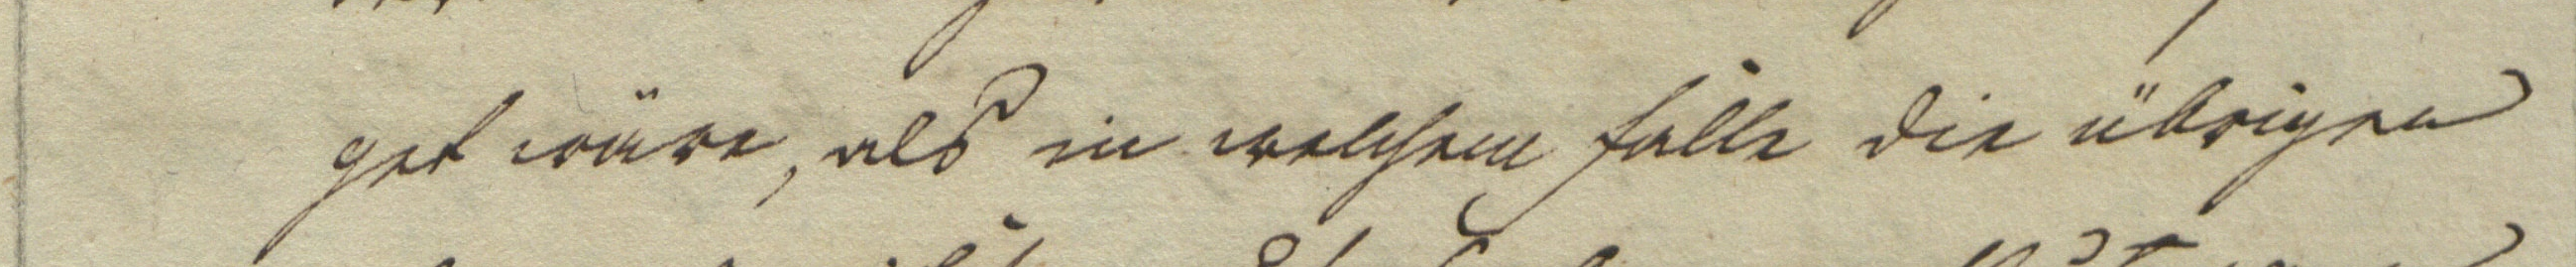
get wäre, als in welchem Falle die übrigen
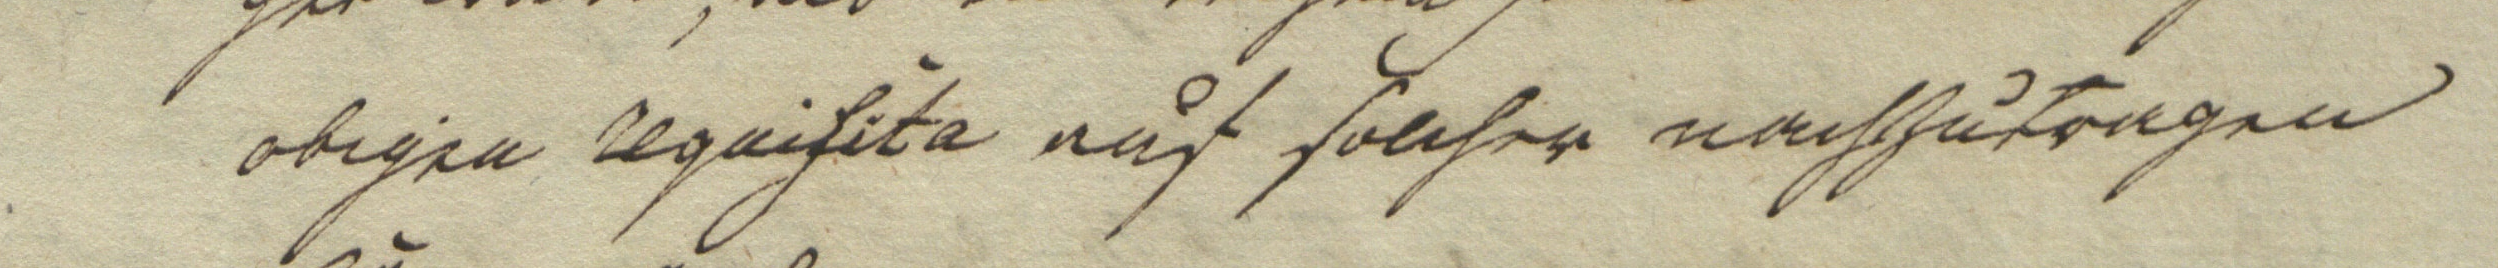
obigen requisita auf solcher nachzutragen
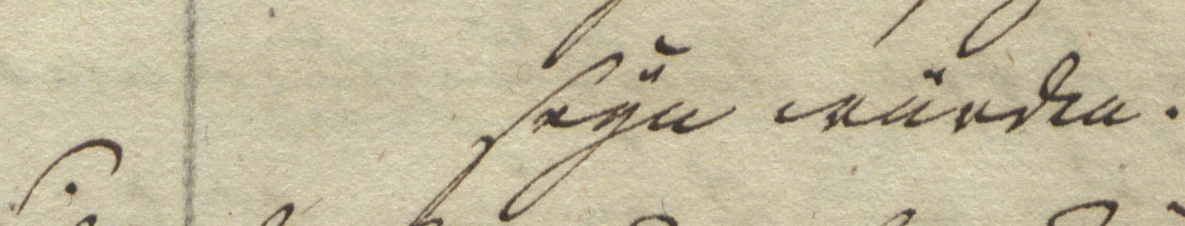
seyn würden.
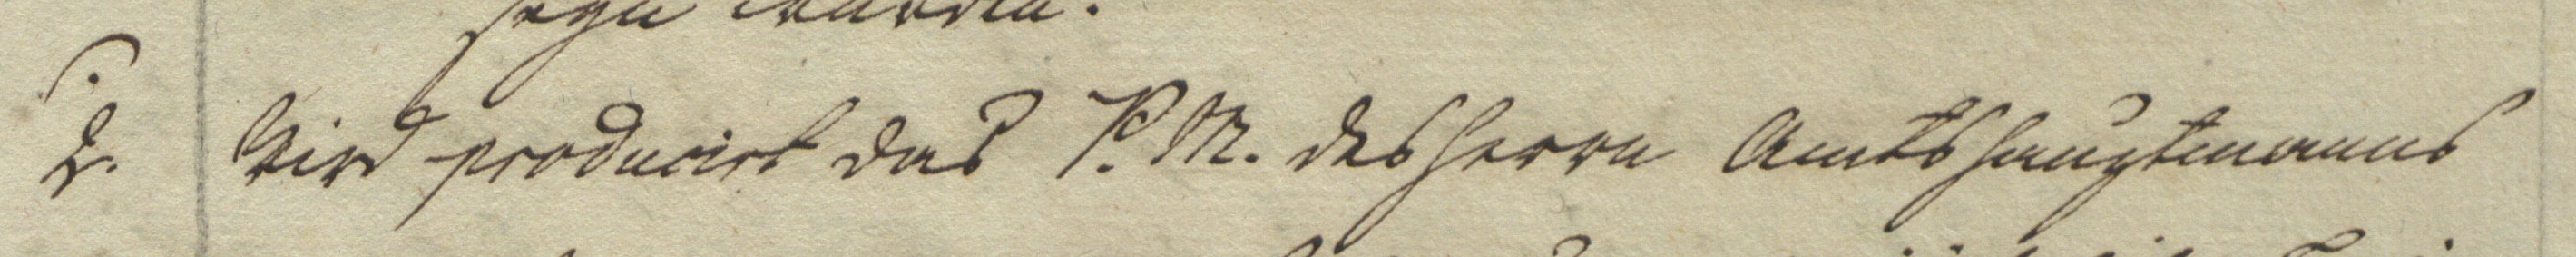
2. Wird producirt das P. M. des Herrn Amtshauptmanns
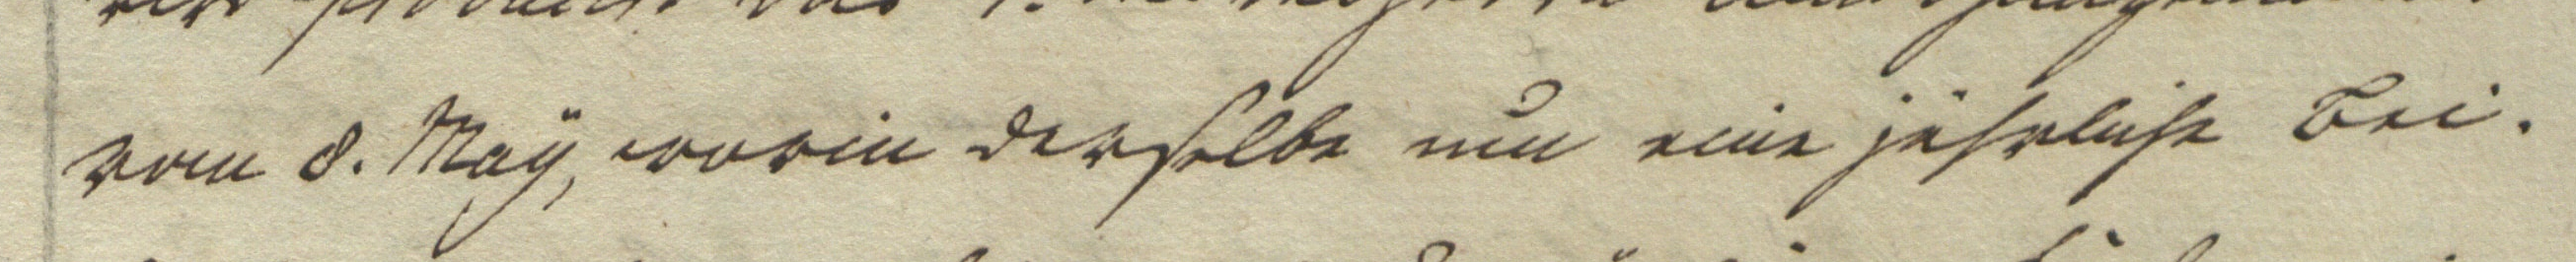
vom 8. May, worin derselbe um eine jährliche Bei¬
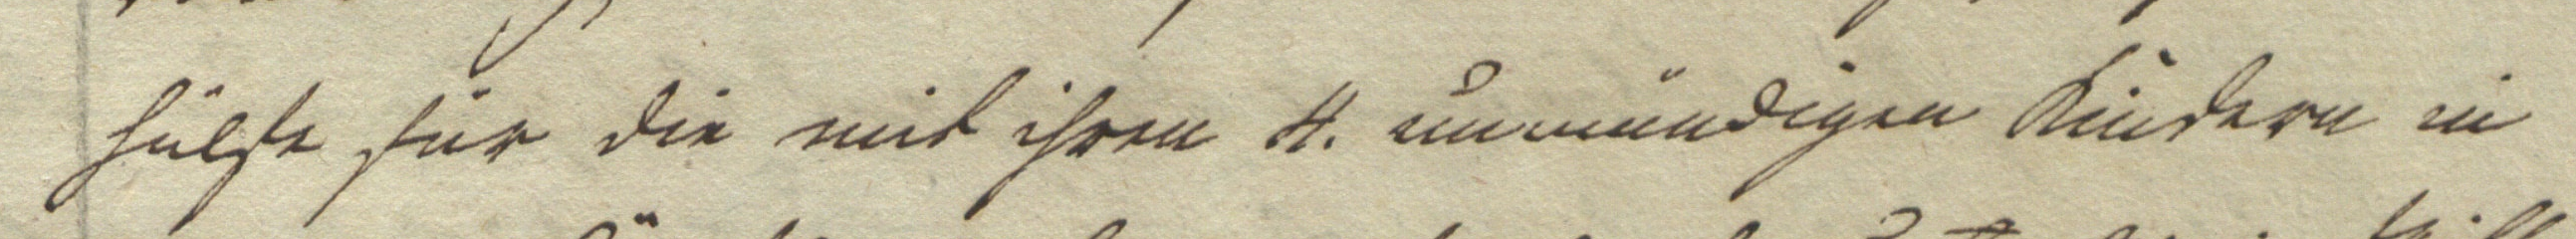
hülfe für die mit ihren 4. unmündigen Kindern in
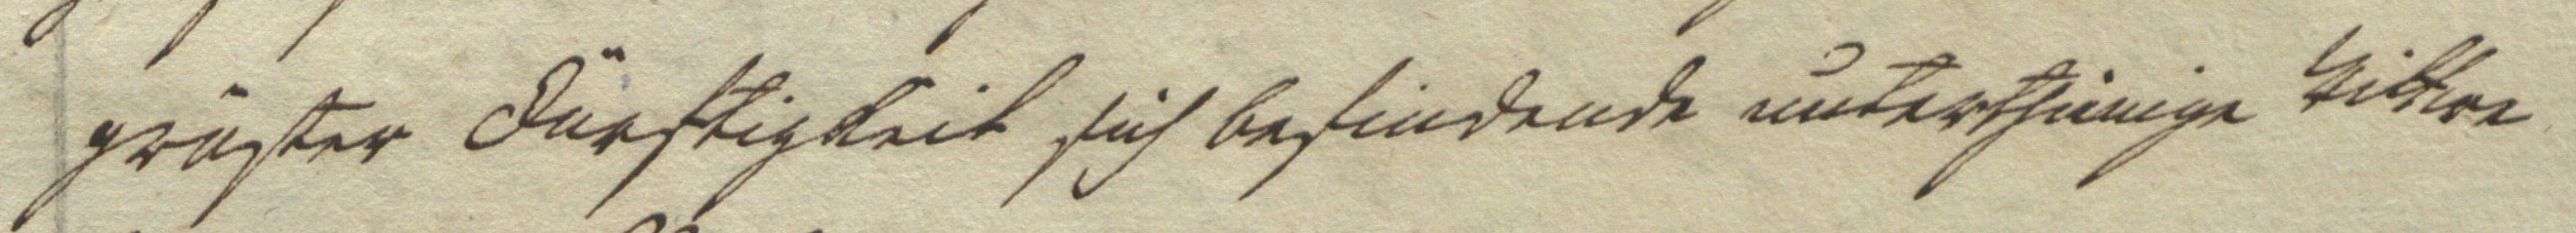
gröster Dürftigkeit sich befindende unterhänige Wittwe
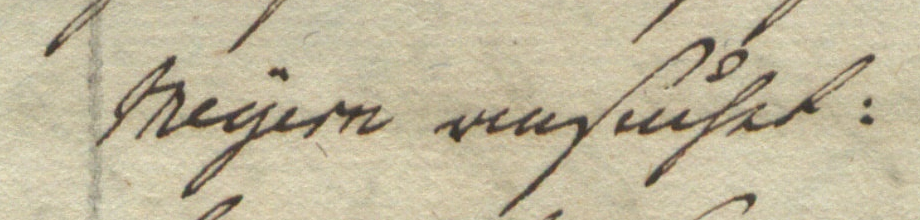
Meyern ansuchet:
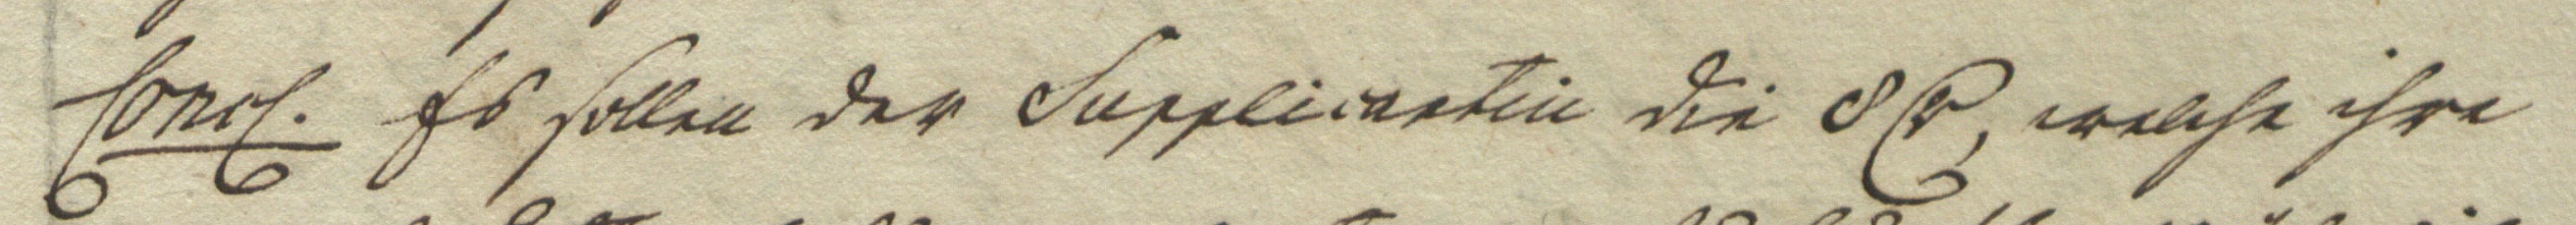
Concl. Es sollen der Supplicantin die 8 rtl., welche ihre
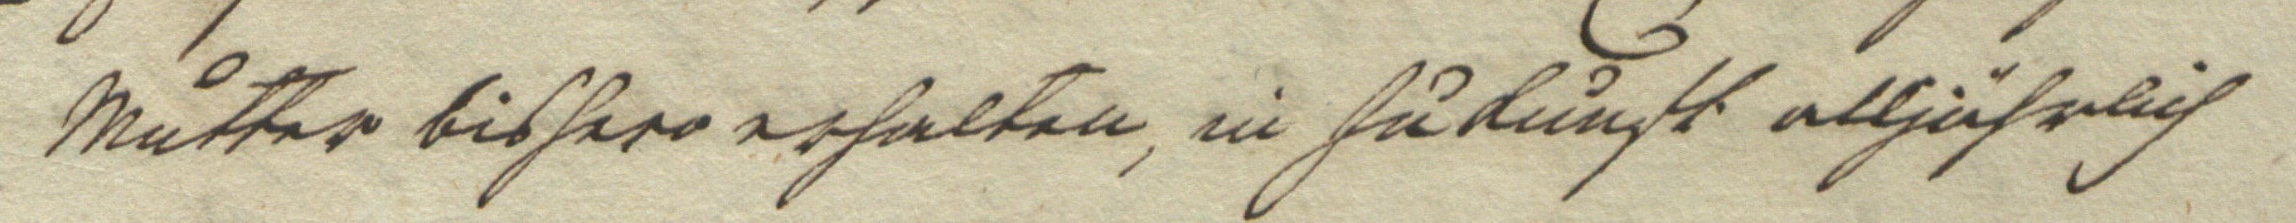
Mutter bishero erhalten, in Zukunft alljährlich
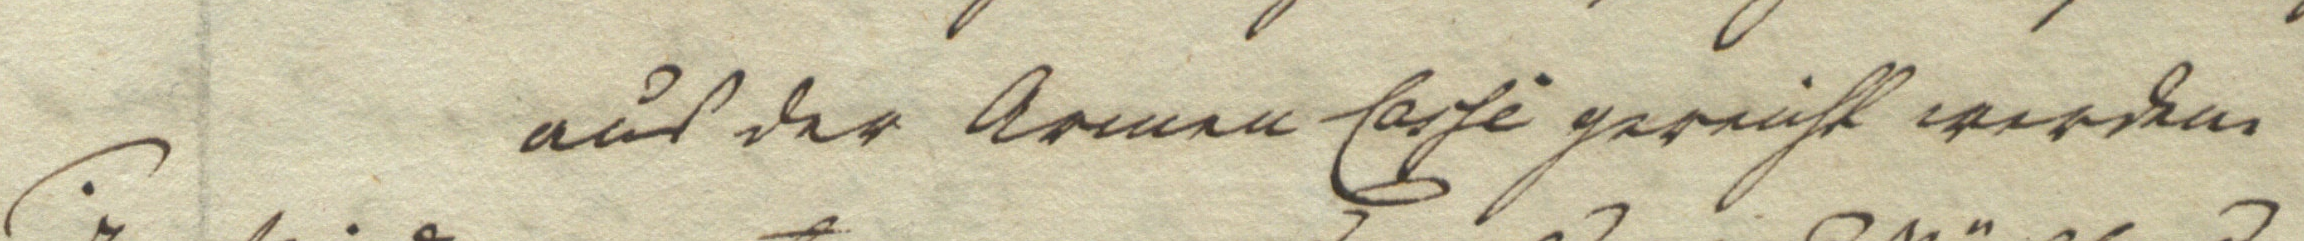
aus der Armen Casse gereicht werden.
